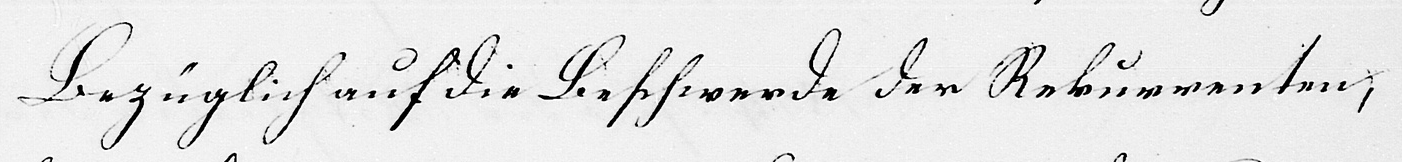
Bezüglich auf die Beschwerde der Rekurrenten,
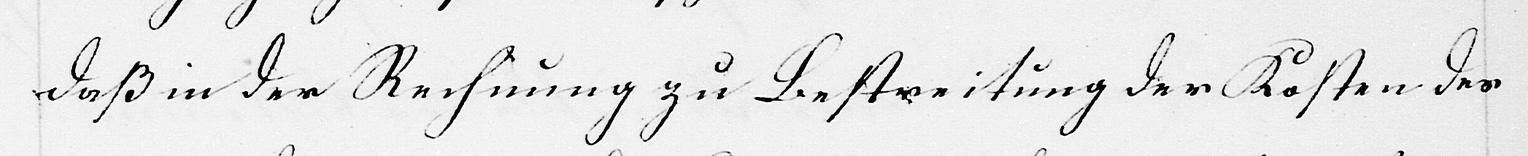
daß in der Rechnung zu Bestreitung der Kosten des
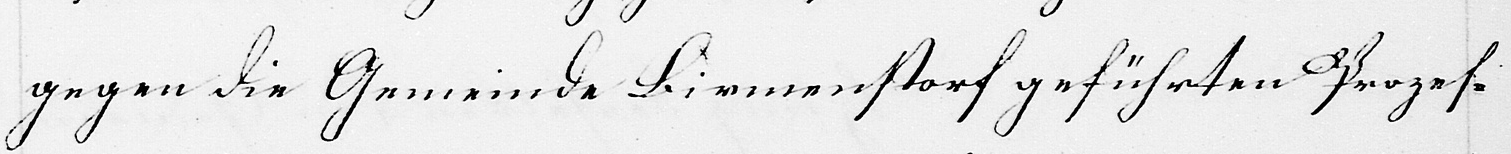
gegen die Gemeinde Birmenstorf geführten Prozes¬
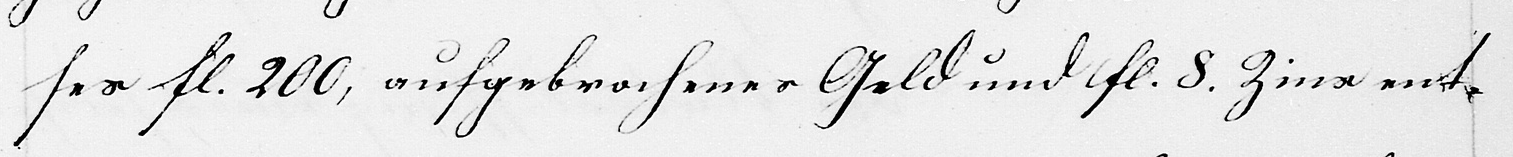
ses fl. 200, aufgebrochenes Geld und fl. 8. Zins ent¬
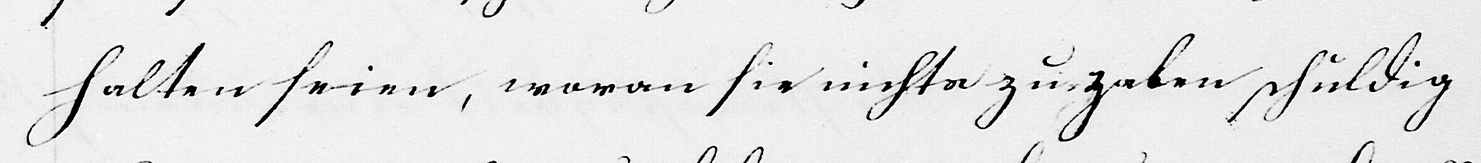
halten seien, woran sie nichts zu zalen schuldig
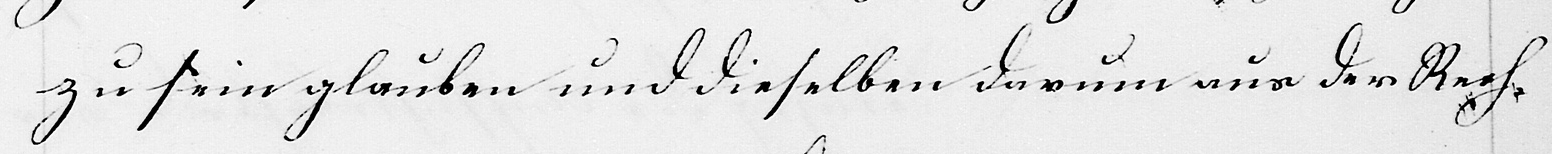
zu sein glauben und dieselben darum aus der Rech¬
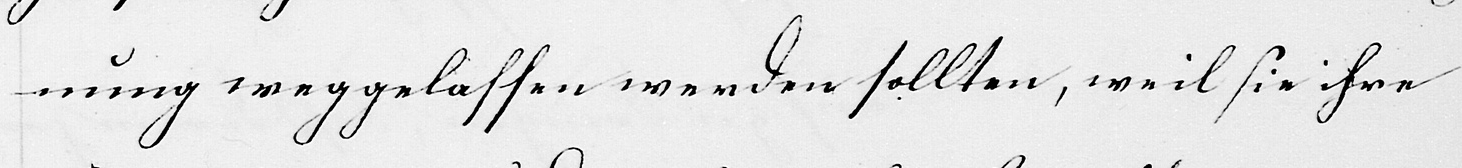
nung weggelassen werden sollten, weil sie ihre
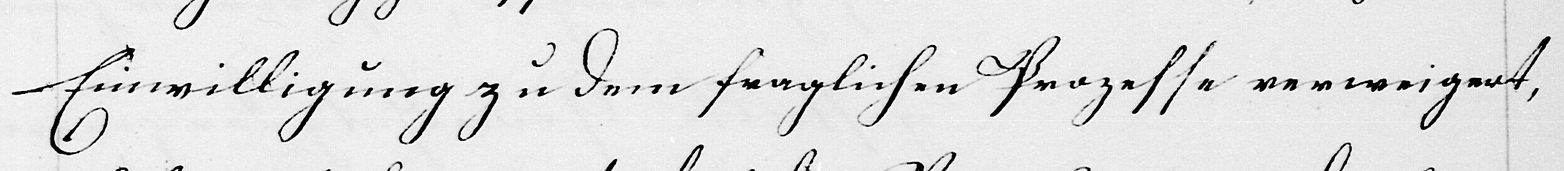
Einwilligung zu dem fraglichen Prozesse verweigert,
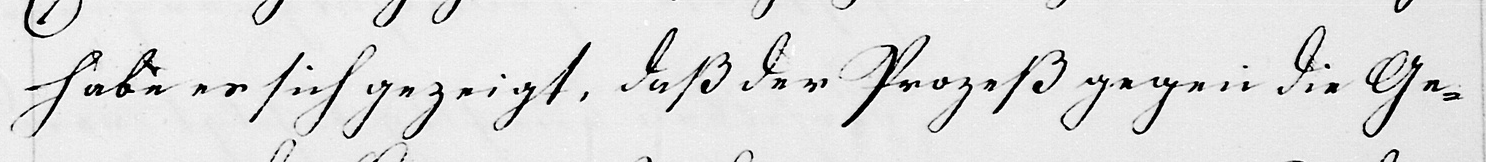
habe es sich gezeigt, daß der Prozeß gegen die Ge¬
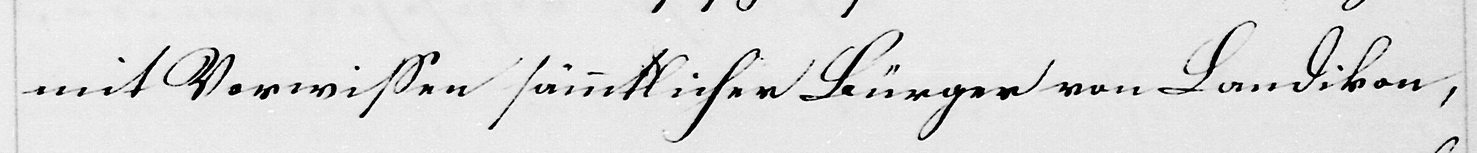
mit Vorwißen sämmtlicher Bürger von Landikon,
